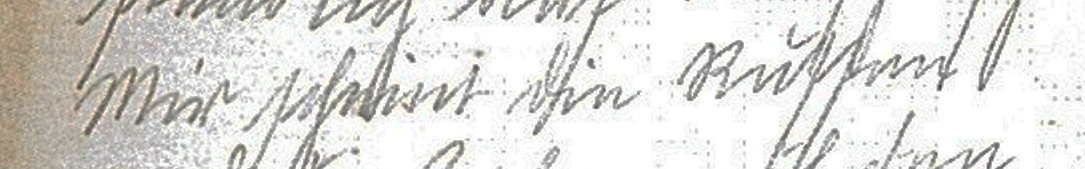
Mir scheint die Russen
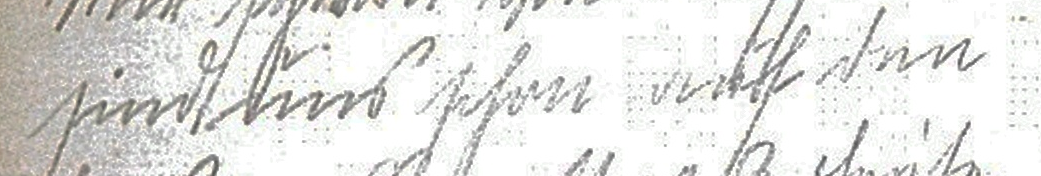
sind uns schon auf den
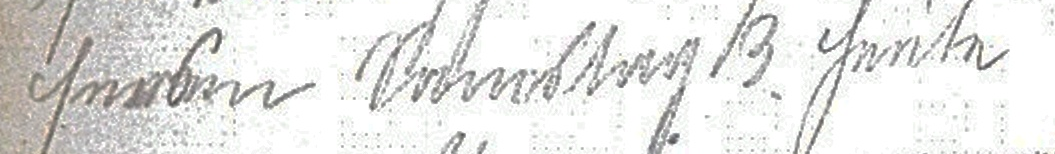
Fersen. Samstag 3. Heute
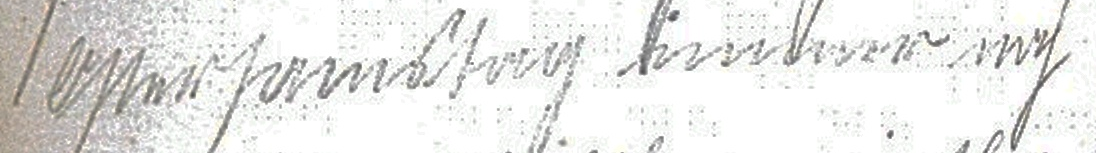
Ostersamstag immer noch
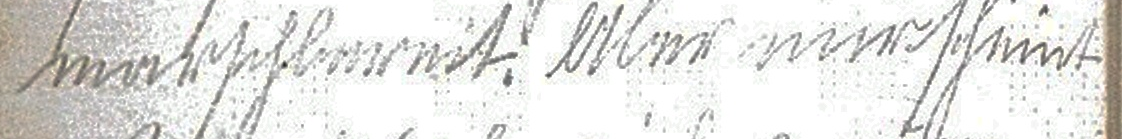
marschbereit. Aber mir scheint
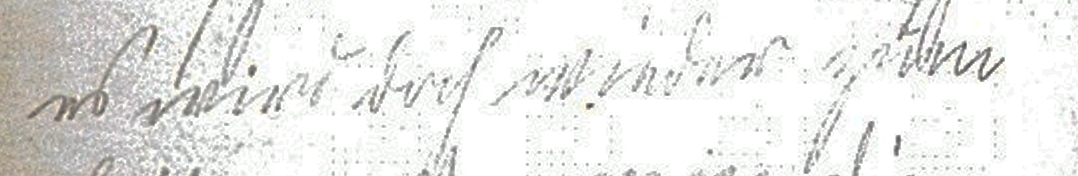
es wird doch wieder zum
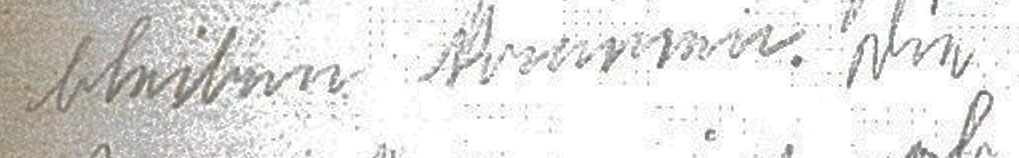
bleiben kommen. Die
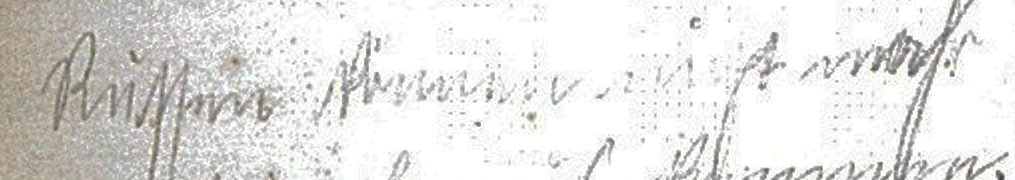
Russen können nicht mehr
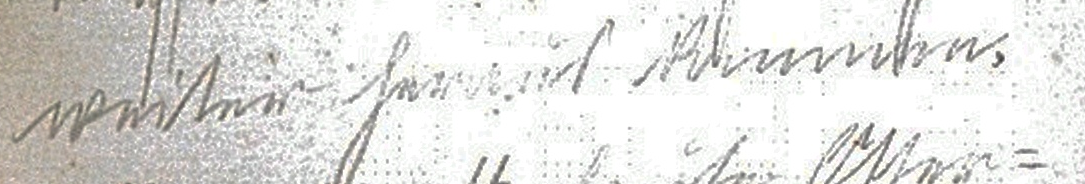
weiter heraus kommen.
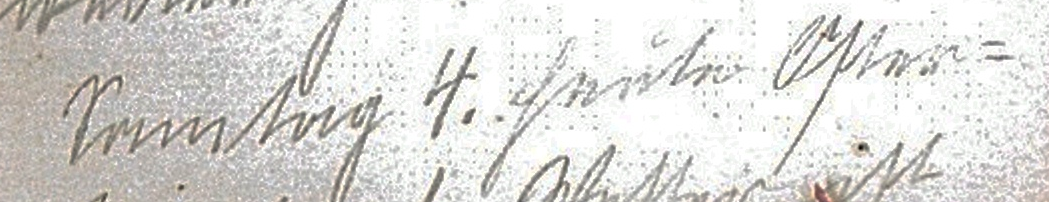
Sonntag 4. Heute Oster-
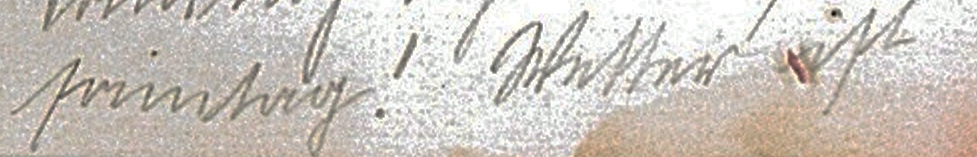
sonntag! Wetter ist
